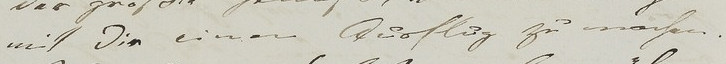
mit Dir einen Ausflug zu machen.
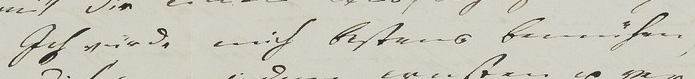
Ich würde mich bestens bemühen,
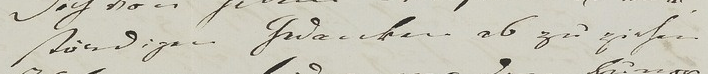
ständigen Gedanken ab zu ziehen.
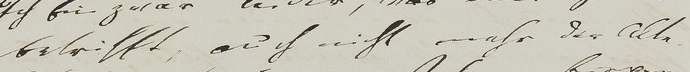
betrifft, auch nicht mehr der Alte.
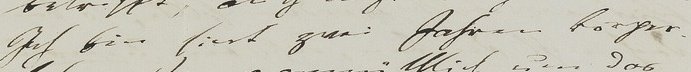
Ich bin seit zwei Jahren körper-
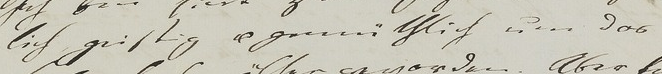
lich, geistig & gemüthlich um das
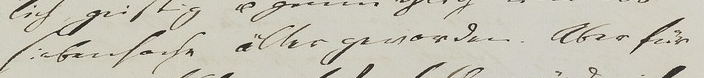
siebenfache älter geworden. Aber für
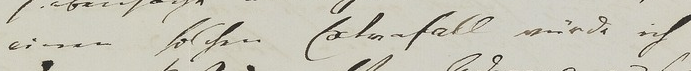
einen solchen Extrafall würde ich
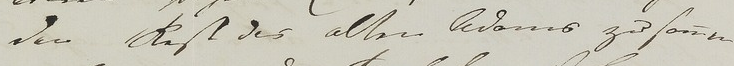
den Rest des alten Adams zusammen
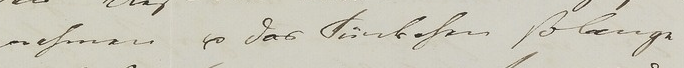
nehmen & das Fünkchen solange
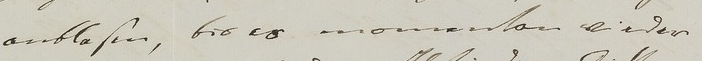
anblasen, bis es momentan wieder
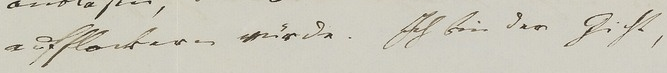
aufflackern würde. Ich bin der Gicht,
